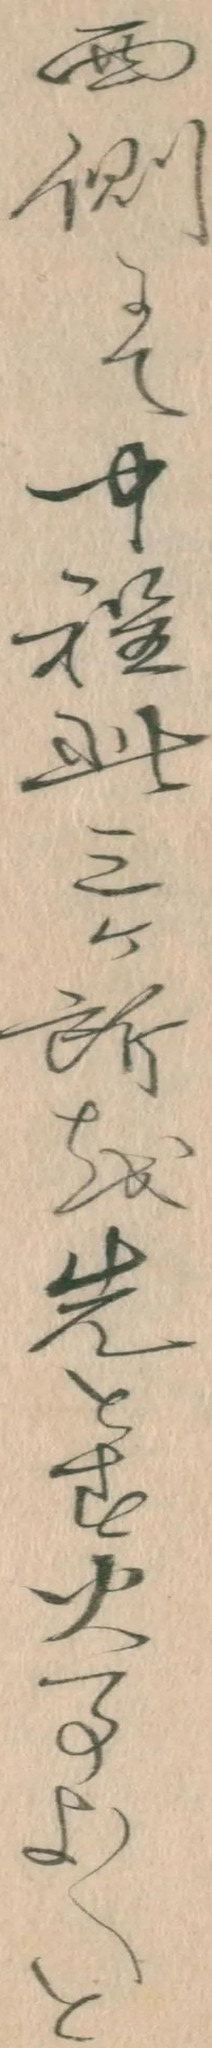西側にて中程此三ヶ所を先とす火事よ〳〵と
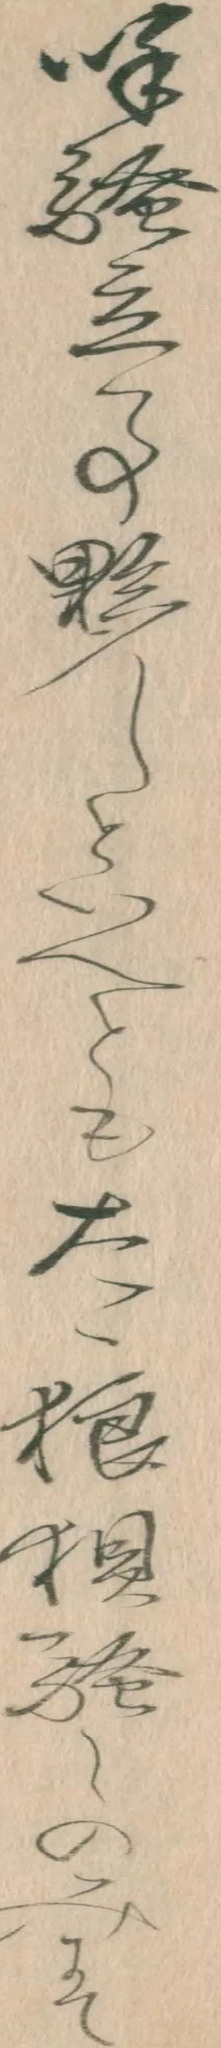呼騒立事夥しといへともたゝ狼狽騒しのみにて
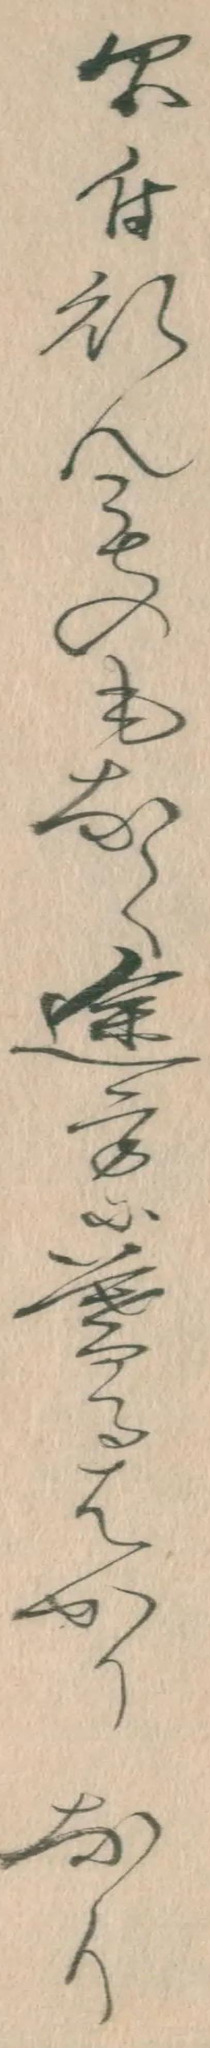欠付行んものもなく途方に暮るはかりなり
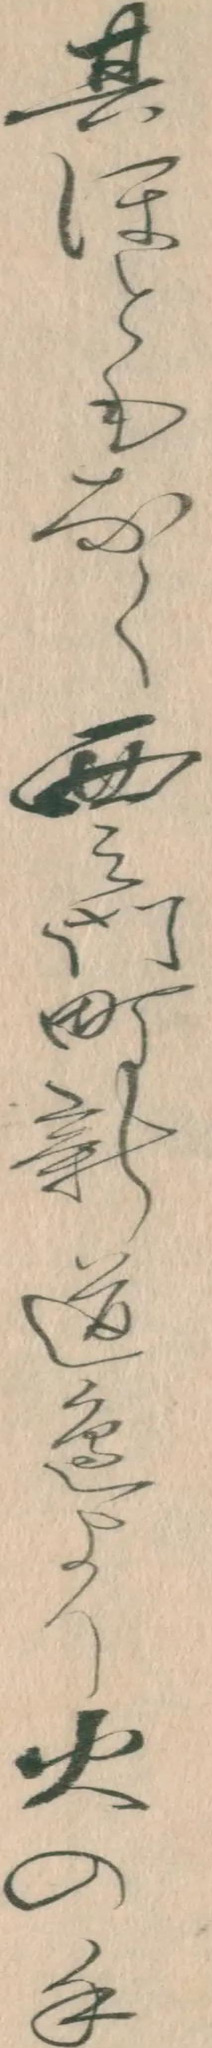其ほともなく西之門町新道辺より火の手
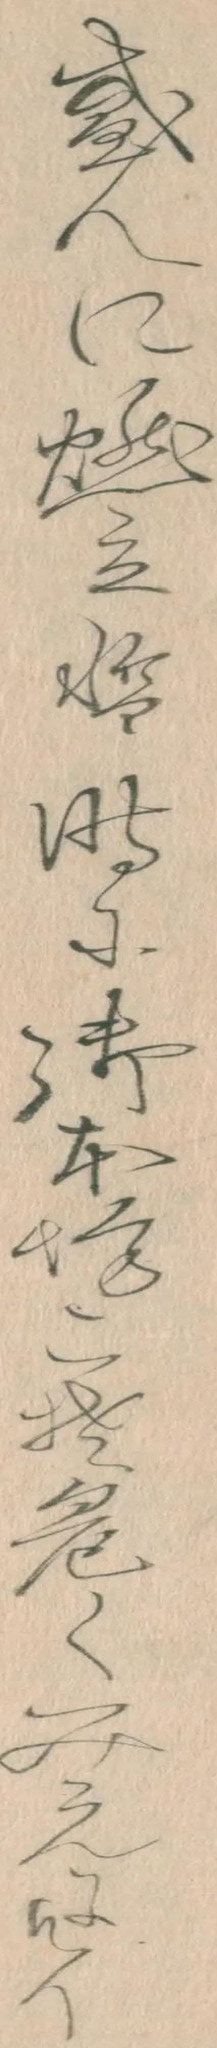盛んに燃立暫時に御本坊こそ危くみえにけり
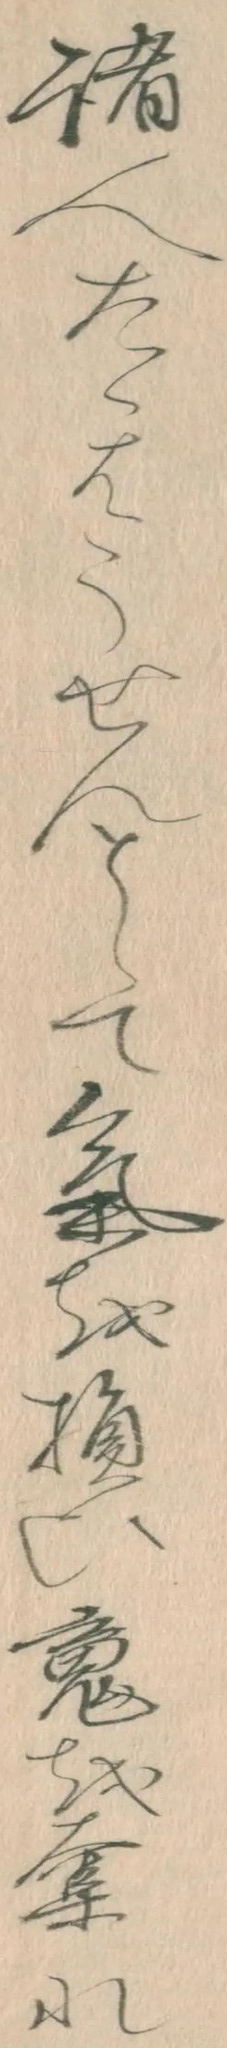諸人たゝはうせんとして気を損い魂を奪れ
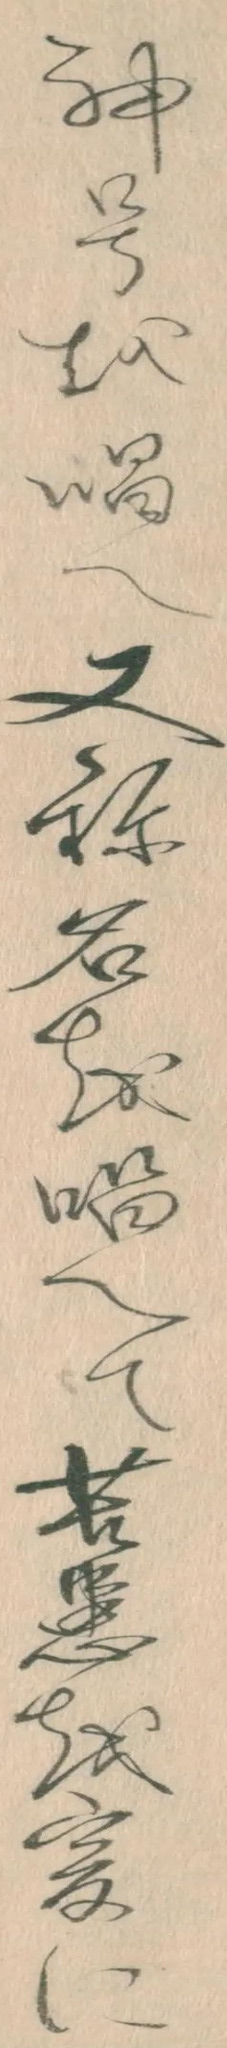神号を唱へ又称名を唱へて苦患を爰に
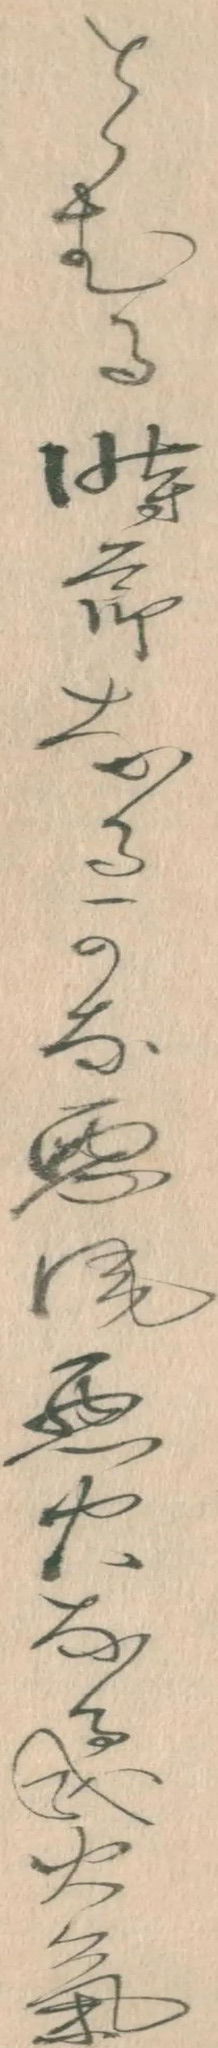とゝむる時節なるかな悪風悪火なる哉火気
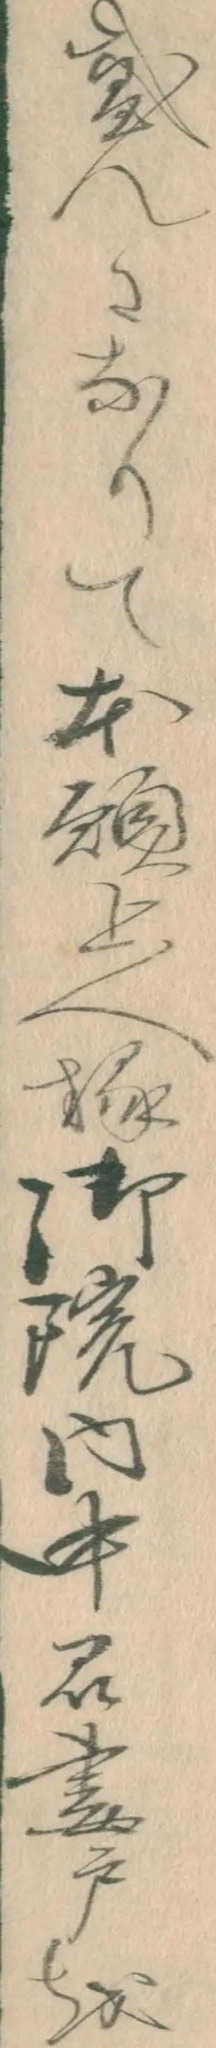盛んになりて本願上人様御院内中衆妻戸を

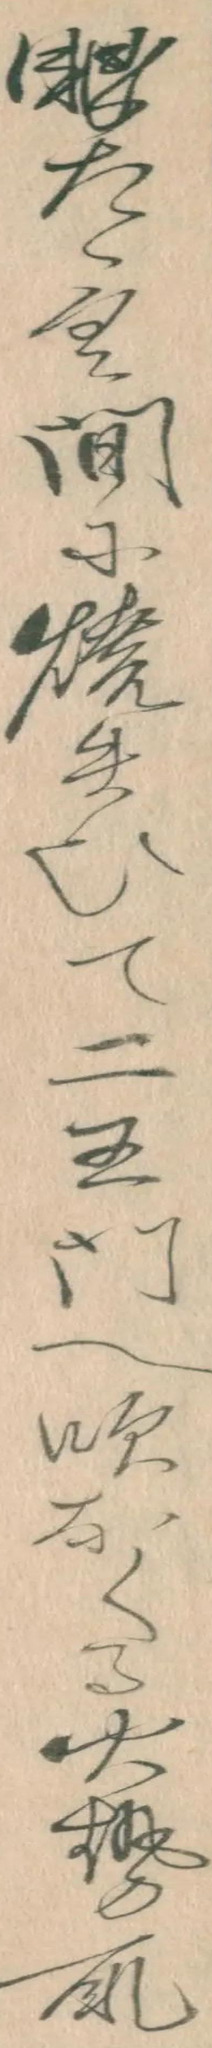眼たゝく間に焼失ひて二王門へ吹なくる火勢取
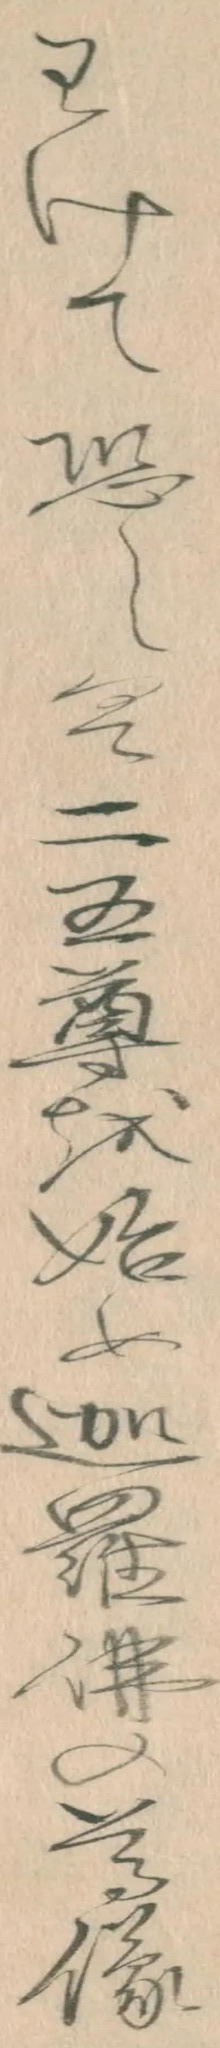わけて恐しく二王尊を始め迦羅仏の尊像
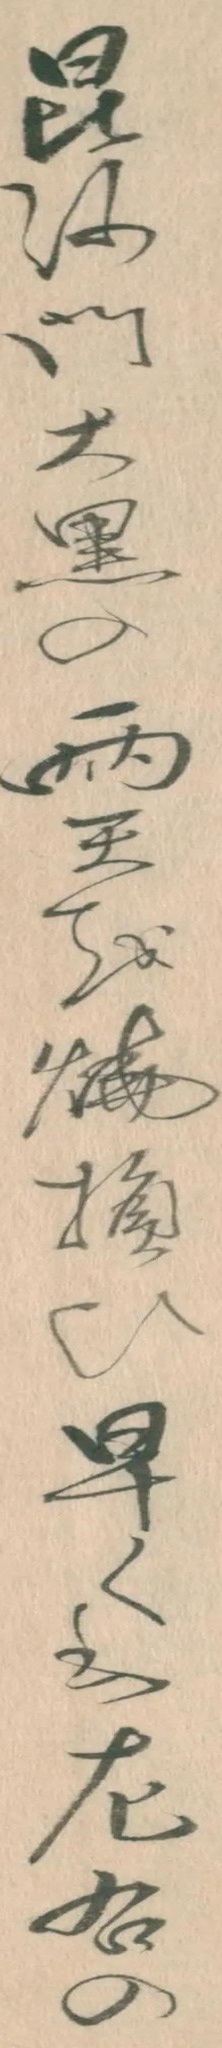毘沙門大黒の両王を焼損ひ早くも左右の
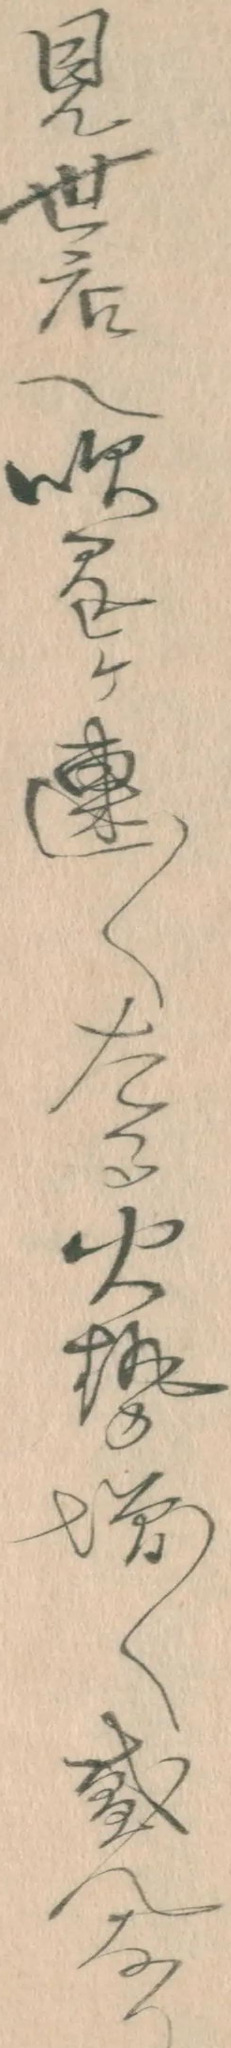見世店へ吹懸ヶ連〳〵たる火勢増〳〵盛んなり
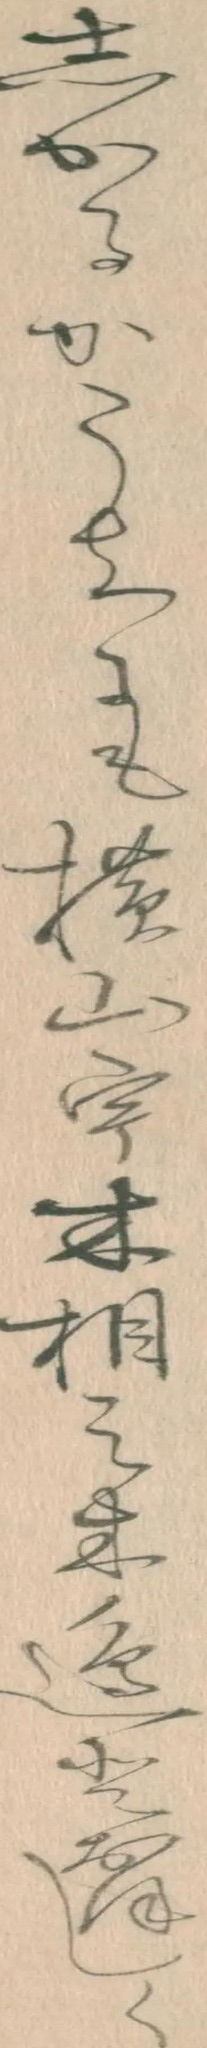しかるかうちにも横山宇木相之木辺とおほしく
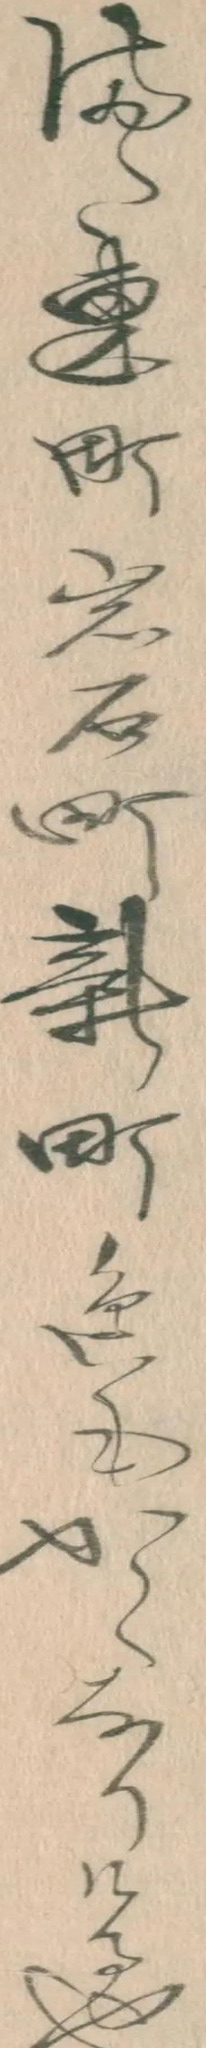また東町岩石町新町辺もかくなりける也
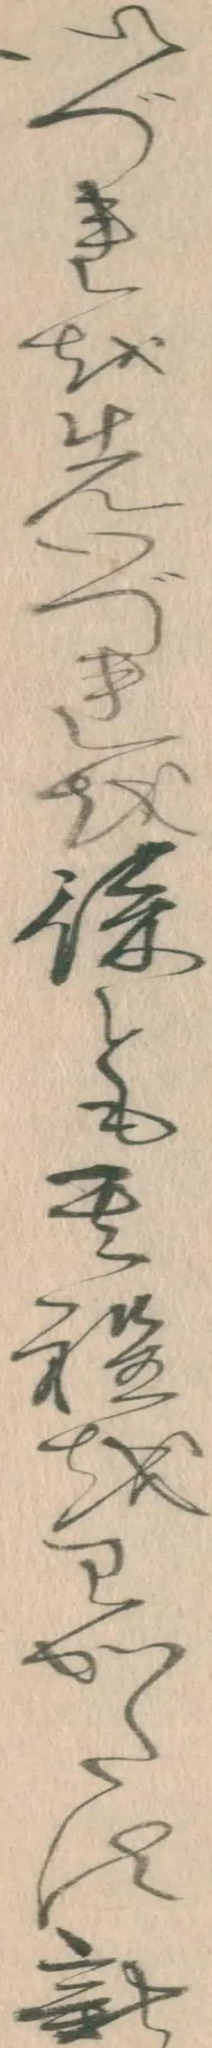いづれを先いづれを後とも其程をわかたす新
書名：俗語之種. [3]
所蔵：国立国会図書館 National Diet Library, JAPAN
